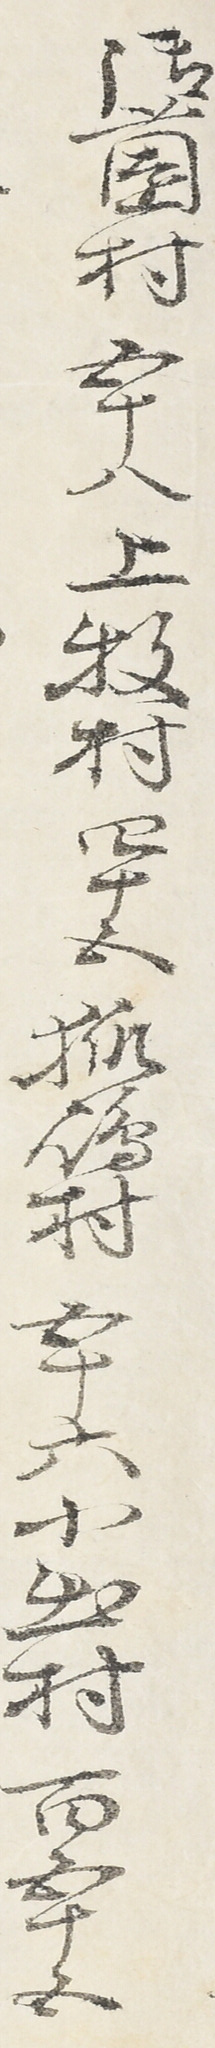御薗村五十八上牧村四十五狐嶋村五十六小出村百五十五
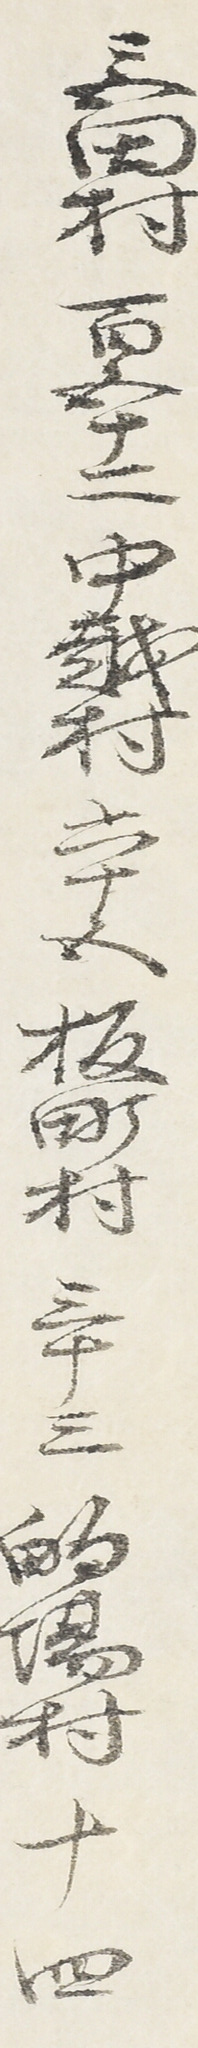宮田村百五十二中越村六十五板町村三十三的場村十四
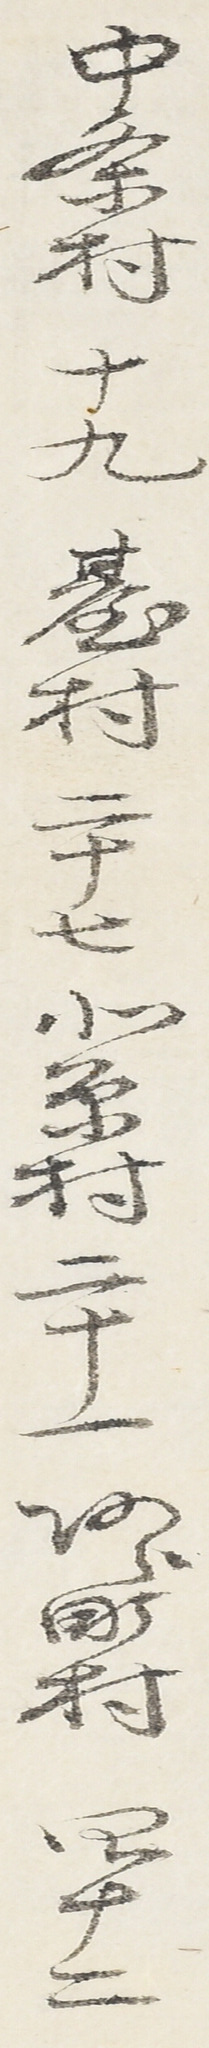中条村十九台村二十七北原村二十一あら町村四十二
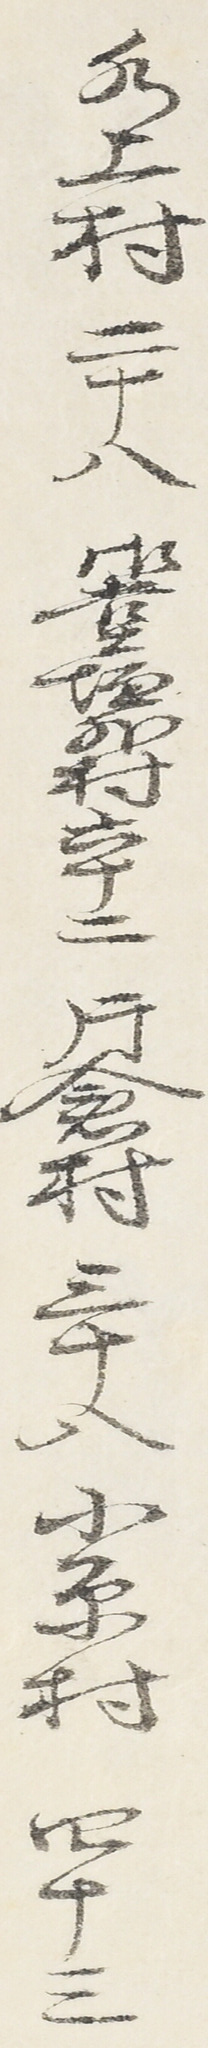水上村二十八御堂垣外村六十二片倉村三十八小原村四十三
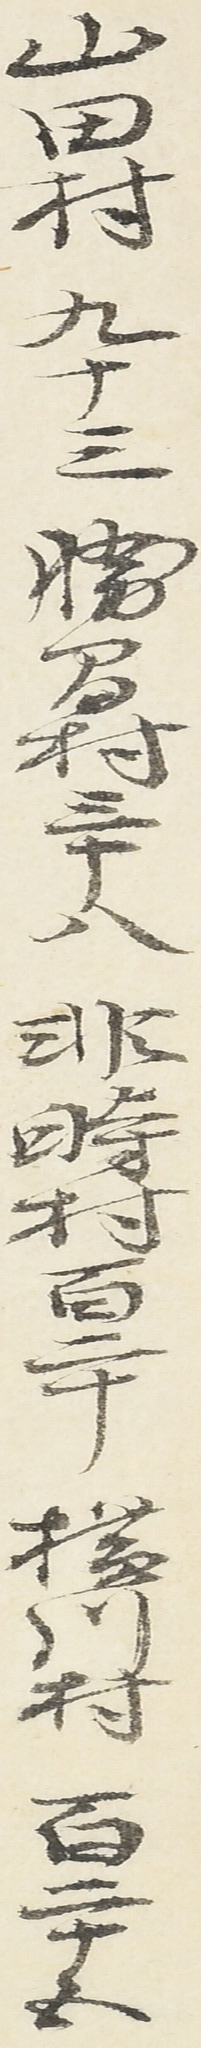山田村九十三勝間村三十八非時村百二十横川村百二十五
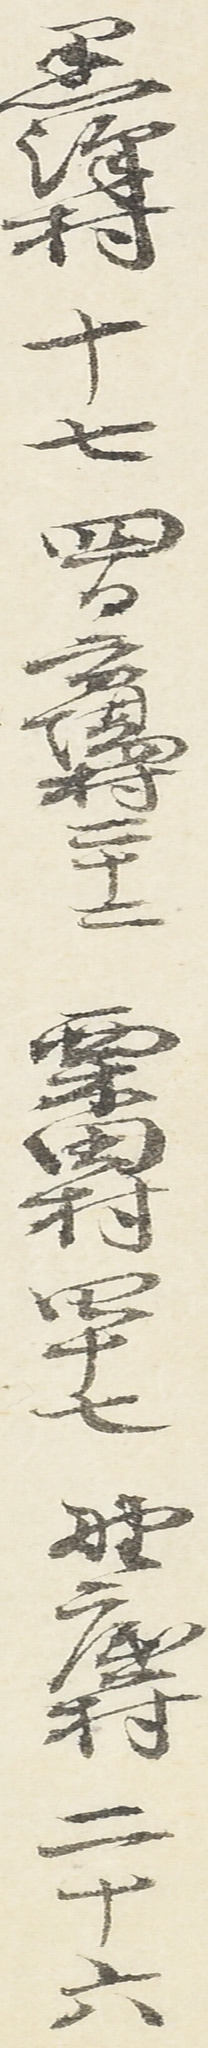黒沢村十七四日市場村二十二栗田村四十七野座村二十六
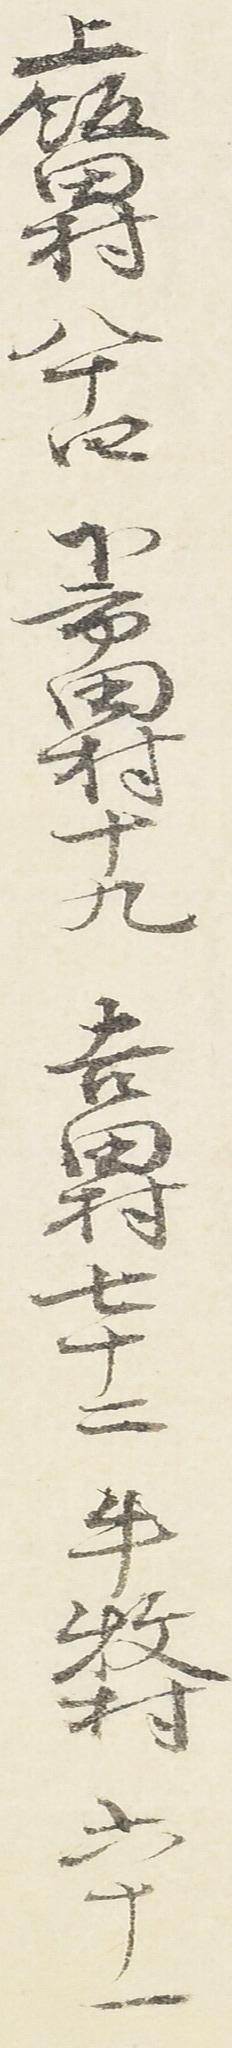上飯田村八十四下市田村十九吉田村七十二牛牧村六十一
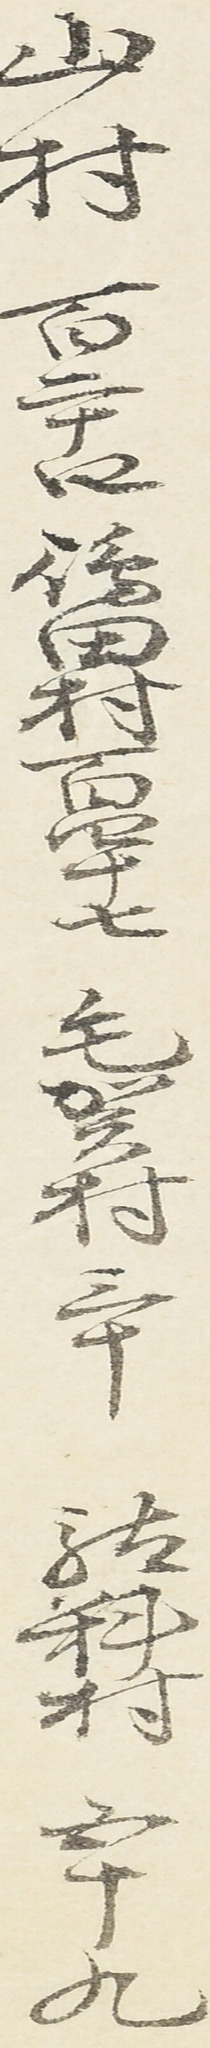山村百二十四嶋田村百四十七毛賀村三十御料村五十九
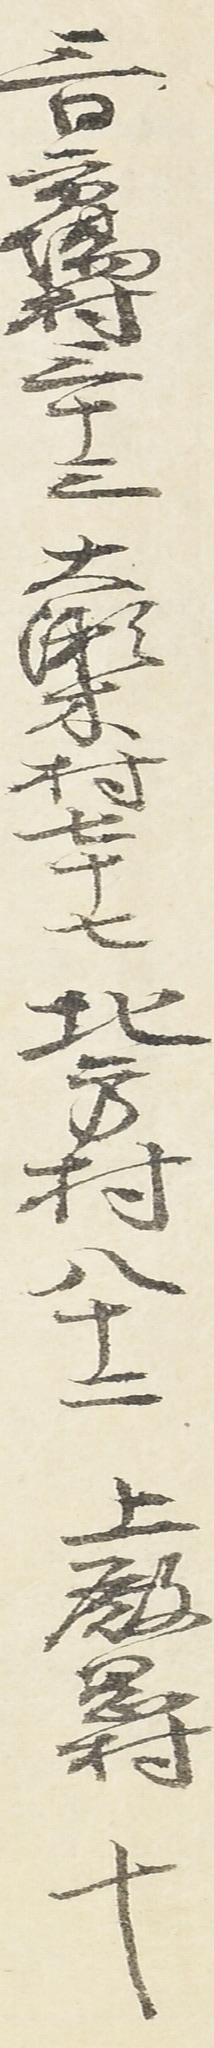三日市場村三十三大瀬木村七十七北方村八十二上殿岡村十
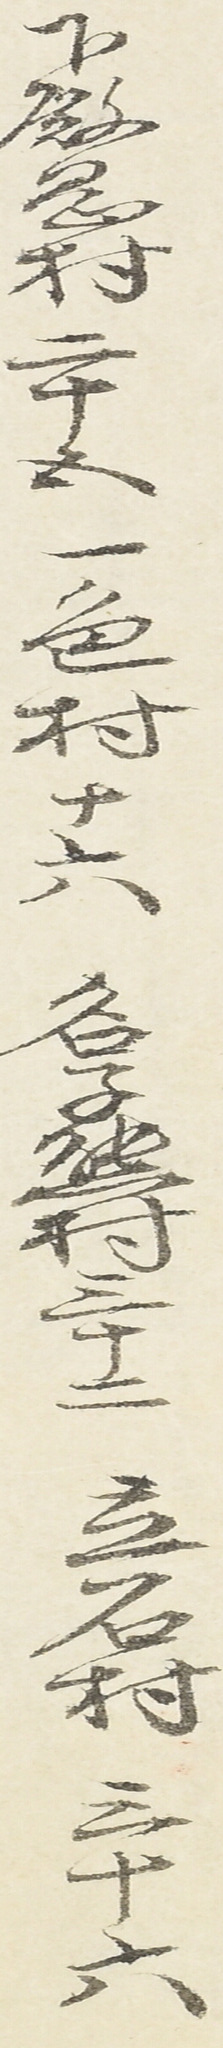下殿岡村二十五一色村十六名子熊村三十二立石村三十六
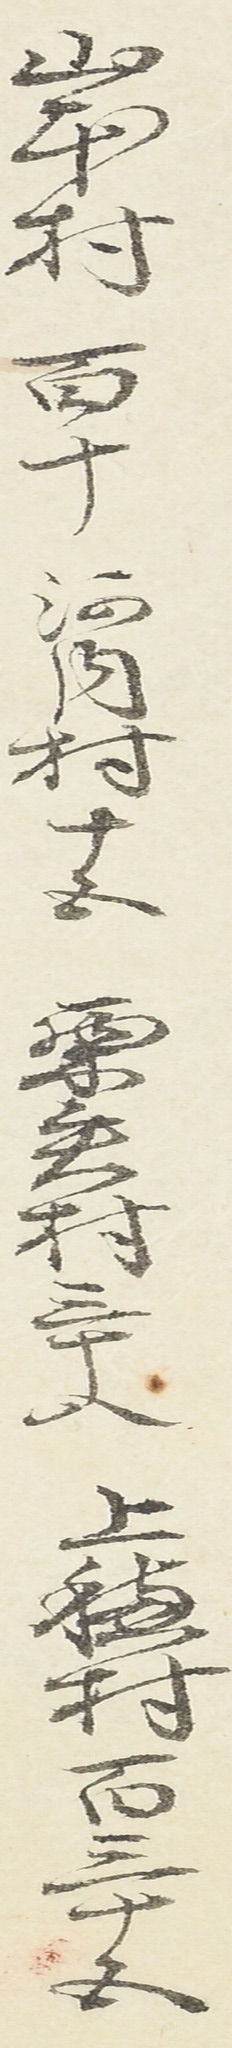山本村百十河内村十五栗矢村三十八上穂村百三十五
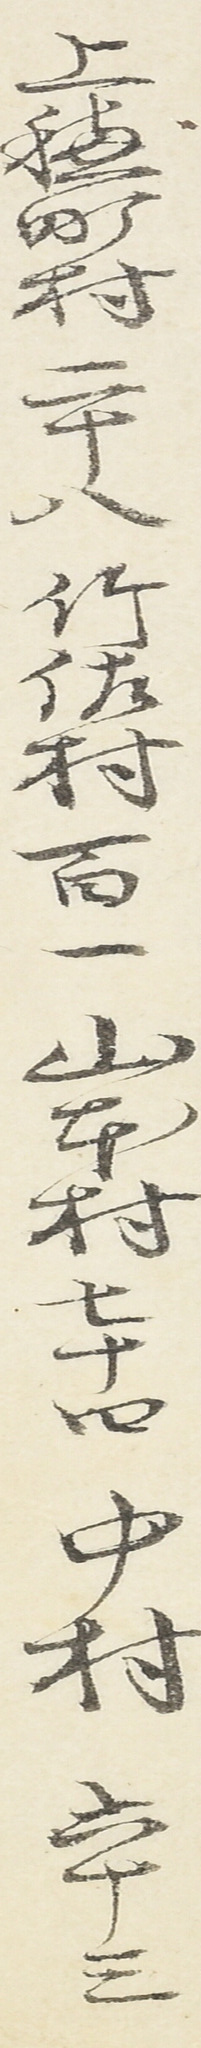上穂町村二十八竹佐村百一山本村七十四中村六十三
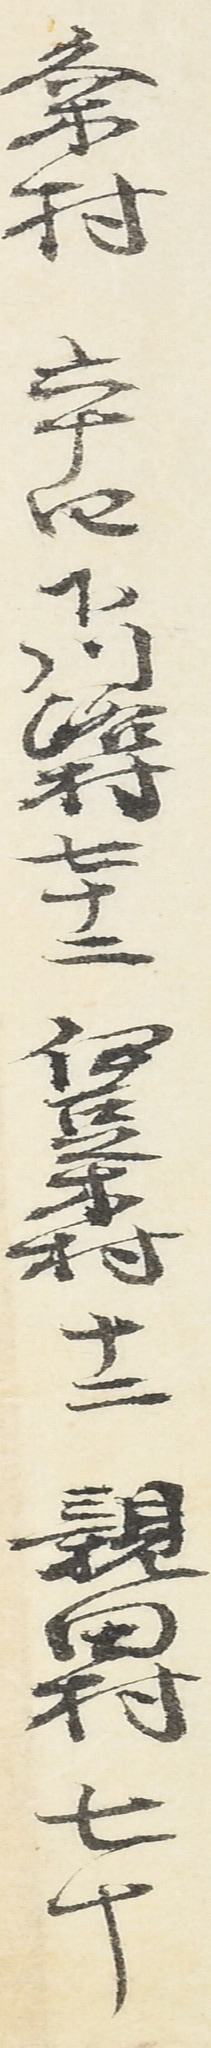粂村六十四下川路村七十二伊豆木村十二親田村七十

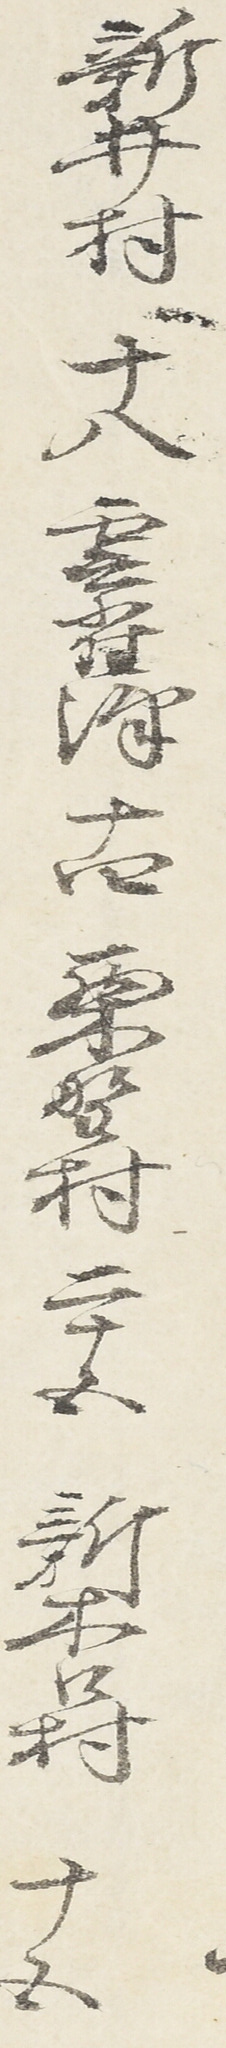新井村十八雲雀沢十四栗野村二十五十五
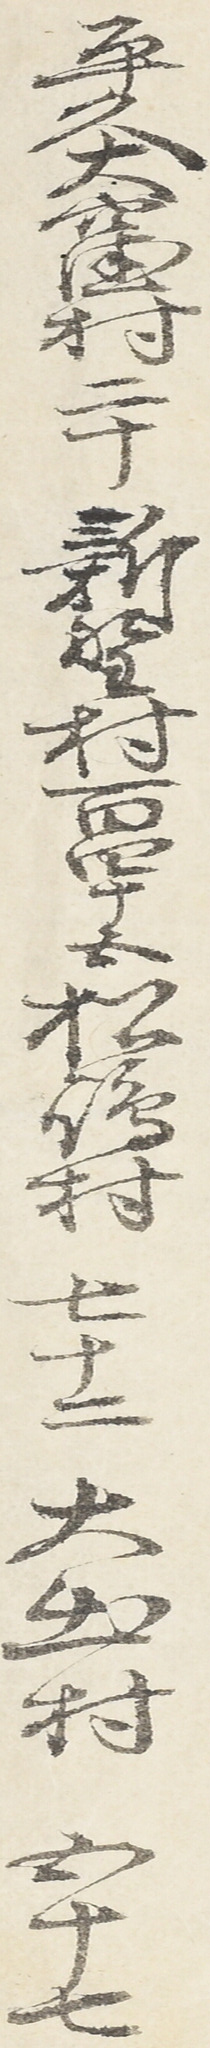平久大窪村二十新野村百四十五松嶋村七十二大出村五十七
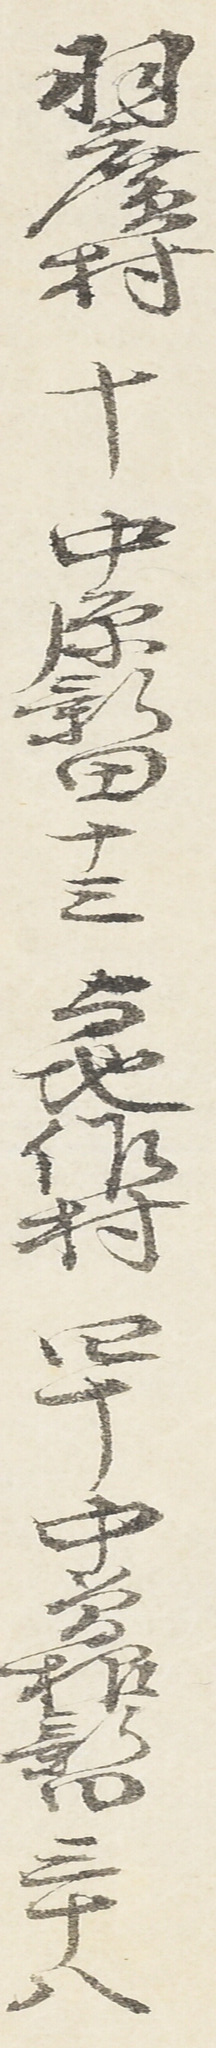羽広村十中原新田十三与地作村四十中曽根新田三十八
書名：中馬御裁許帳面
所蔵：伊那市立高遠町図書館・合同会社AMANE
